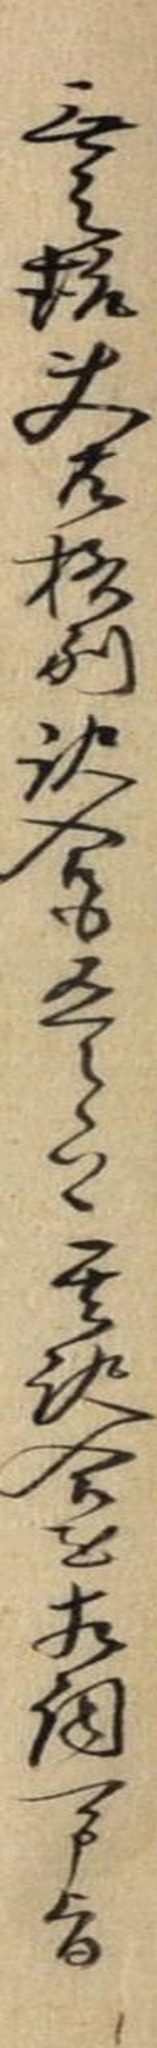無之趣夫共格別訳合も有之候ハヽ其訳合を相伺可申旨
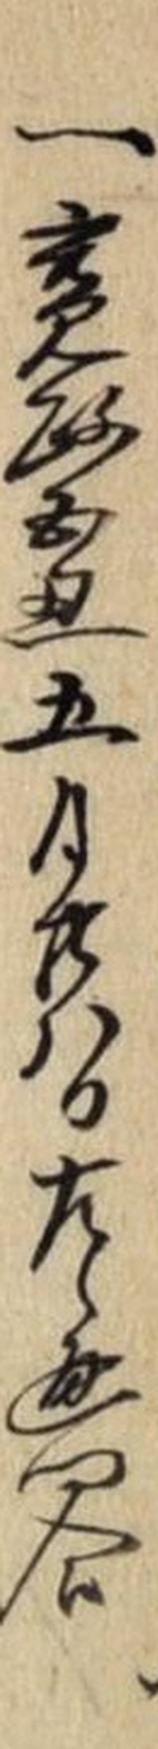一寛政五丑五月廿八日左之通問合
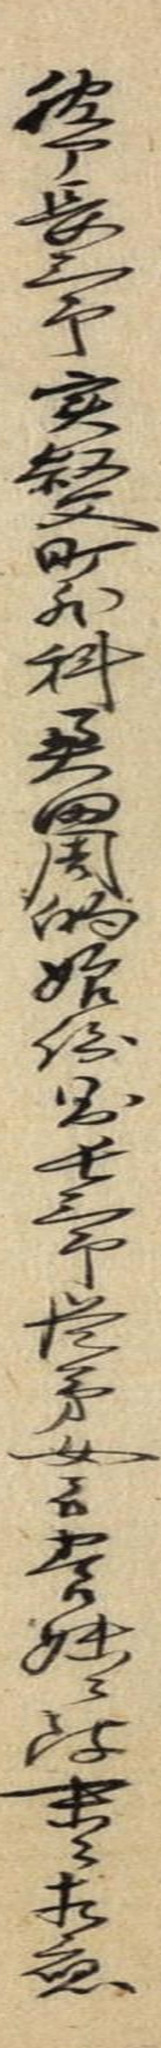服部長三郎実叔父町外科奥田周的娘儀則長三郎従弟女ニ付養妹ニ致末々相応
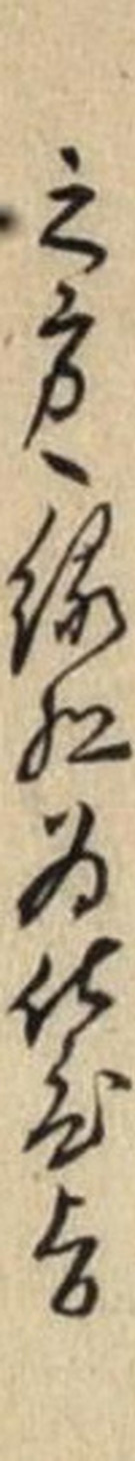之方へ縁組為仕度旨
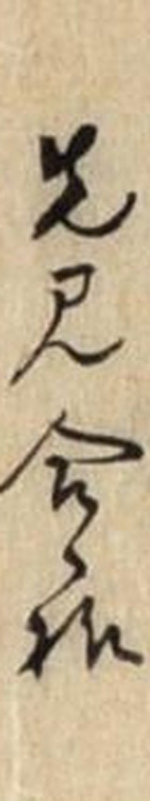先見合候様
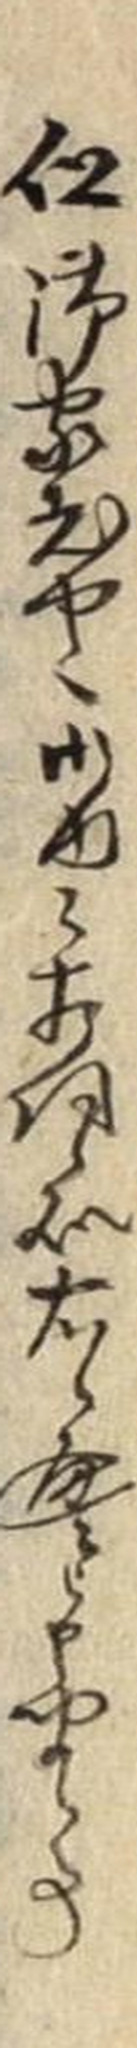但御家老中へ御内々相伺候処右之通ニ被申聞候事
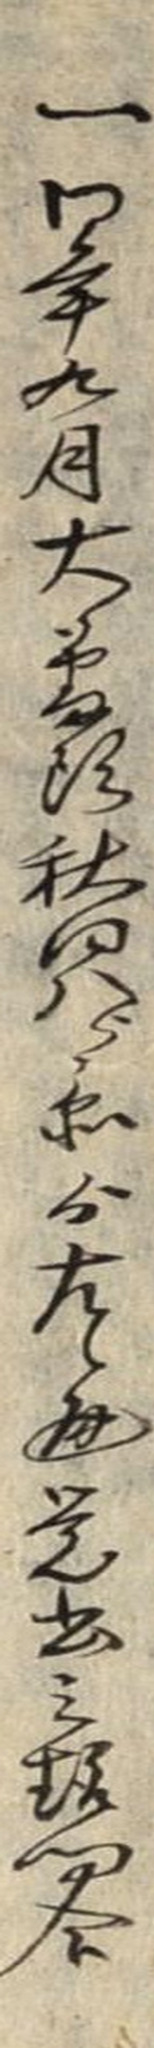一同年九月大御番頭秋田八郎兵衛ゟ左之通覚書之趣問合
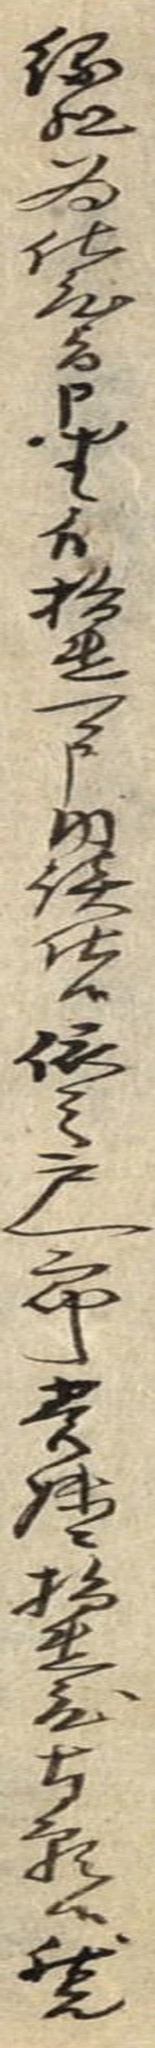縁組為仕度旨申聞候に付指置可申内談仕候依之戸一郎養妹と指置度相願候然ル
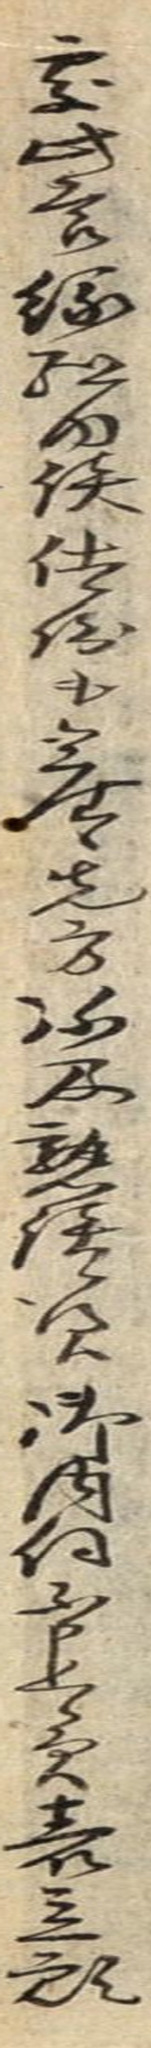処此節縁組内談仕候儀も御座候先方弥及熟談候得ハ御内伺不申上候而ハ表立願
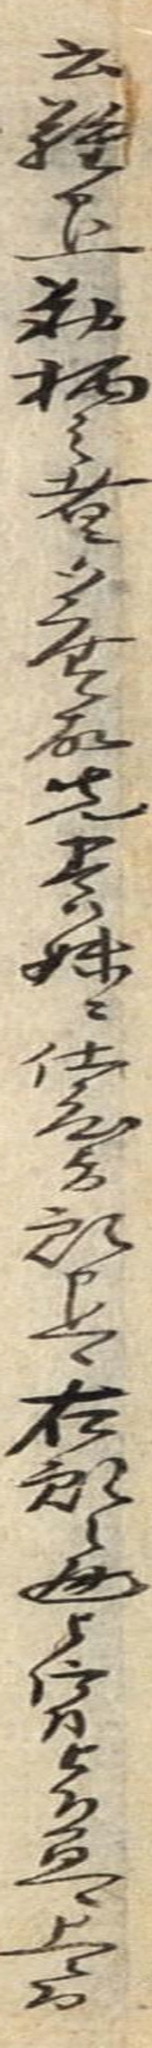書難申上勤柄之者ニ御座候故先養妹ニ仕度旨願申上候右願之通被仰付被下置候上ニ而
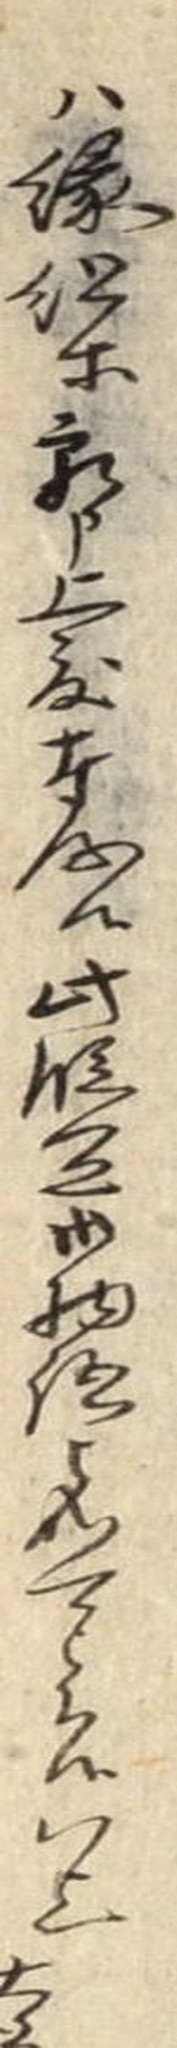ハ縁組等願申上度奉存候此段宜御物語被成可被下候以上

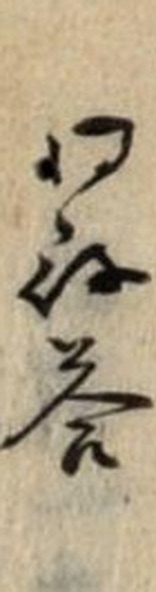同役答
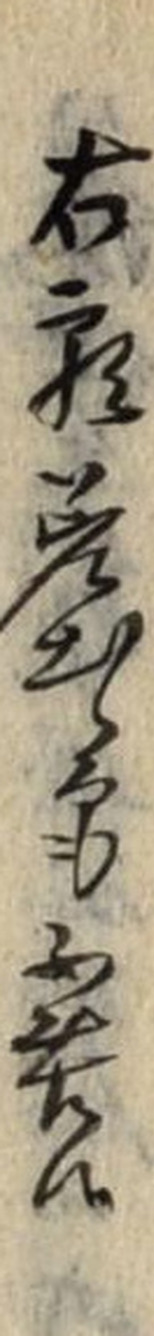右願差出候而も不苦候
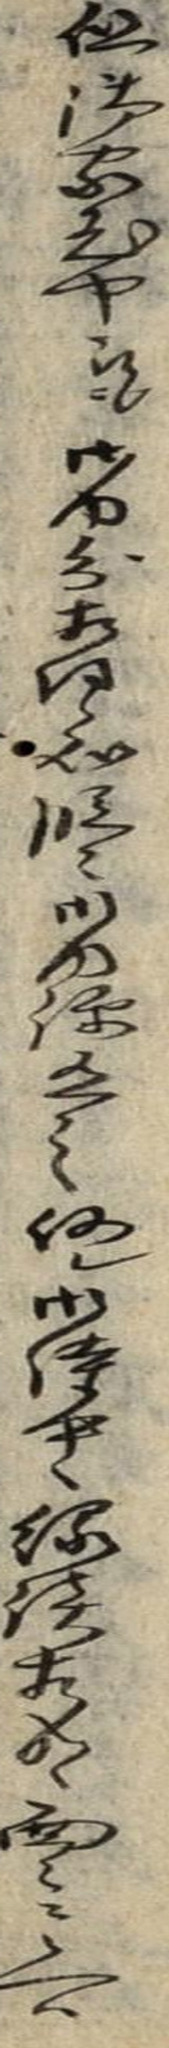但御家老中江も御内分相伺候処段々御内評有之何レ御侍中へ縁談相成候面々二候へハ
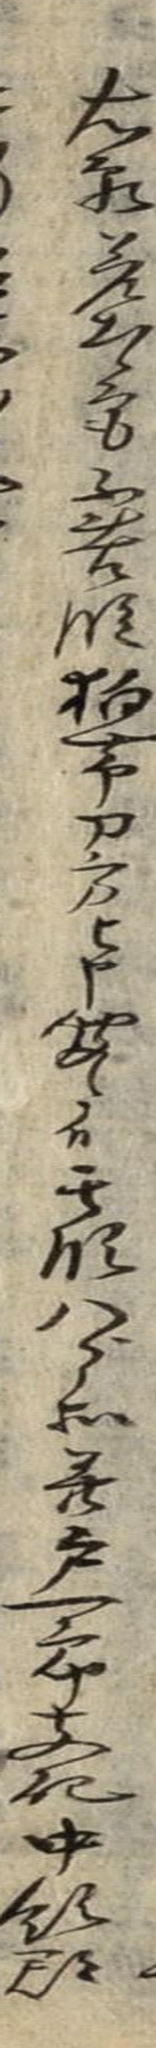右願差出候而も不苦段狛帯刀方被申聞候ニ付其段八郎兵衛并戸一郎支配中領郡
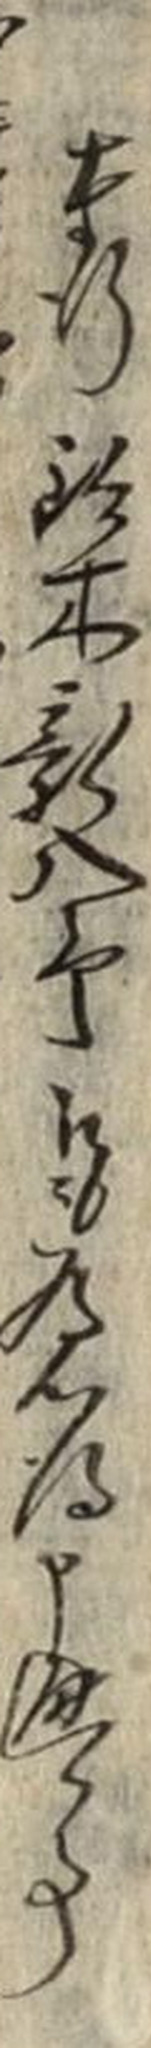奉行鈴木新八郎江も為心得申通候事
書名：養子縁組之部
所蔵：福井県文書館 Fukui Prefectural Archives
